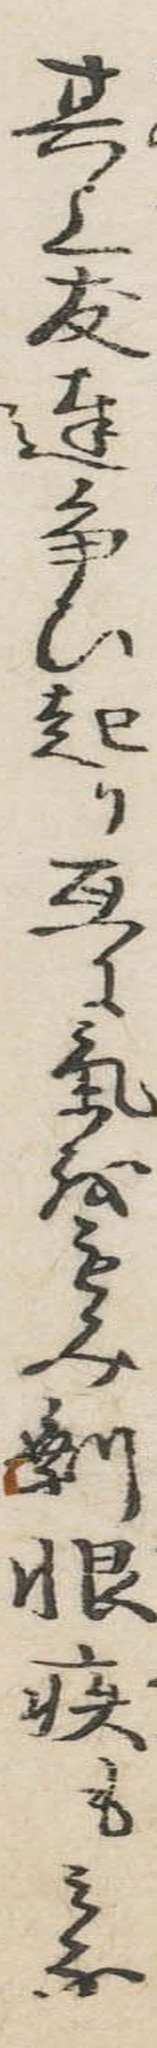其上友達争ひ起り互に気をもみ剰恨疾もみな
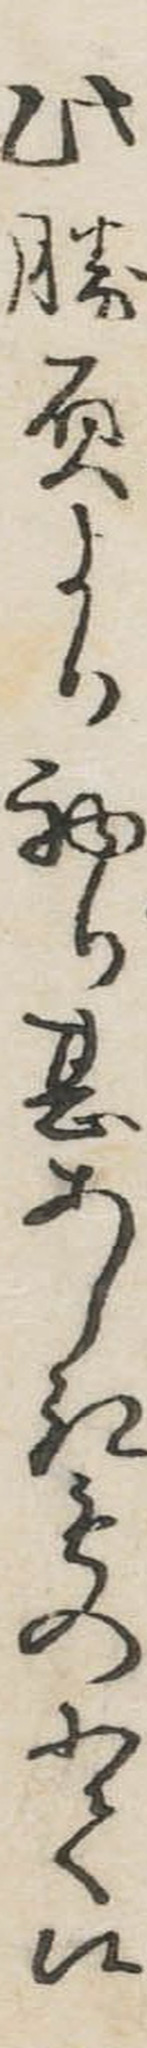此勝負より初り甚あしきものにて候
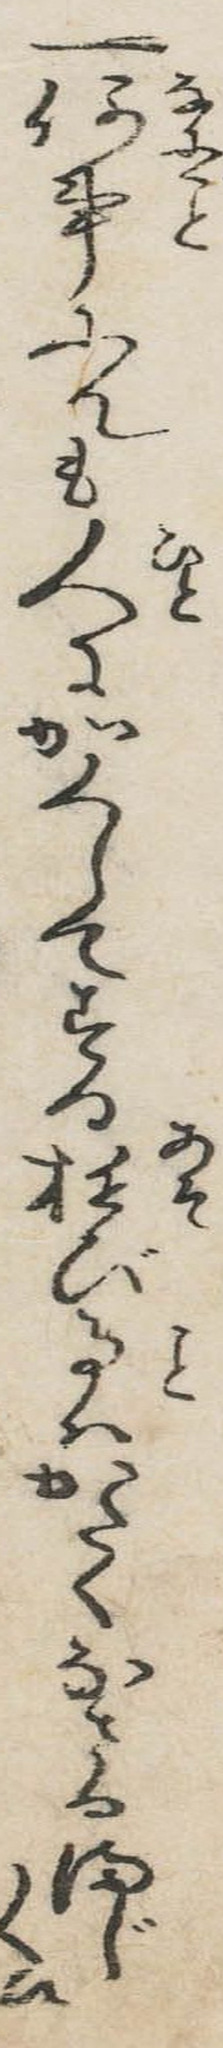一何事にても人にかくしてする遊び事はかたくなさるまじく候
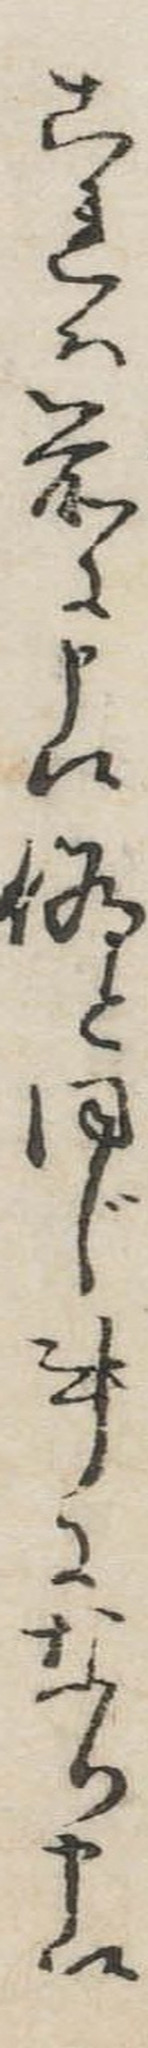これは前に申候偽と同じ事になり申候
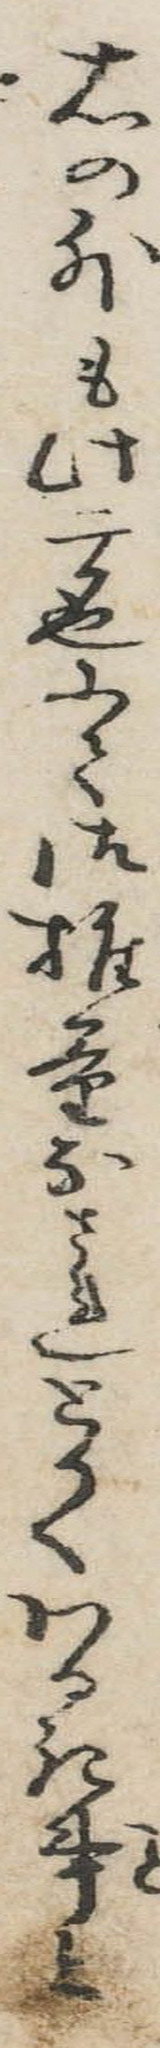右の外も此二色にて御推量なされとかくわるき事と
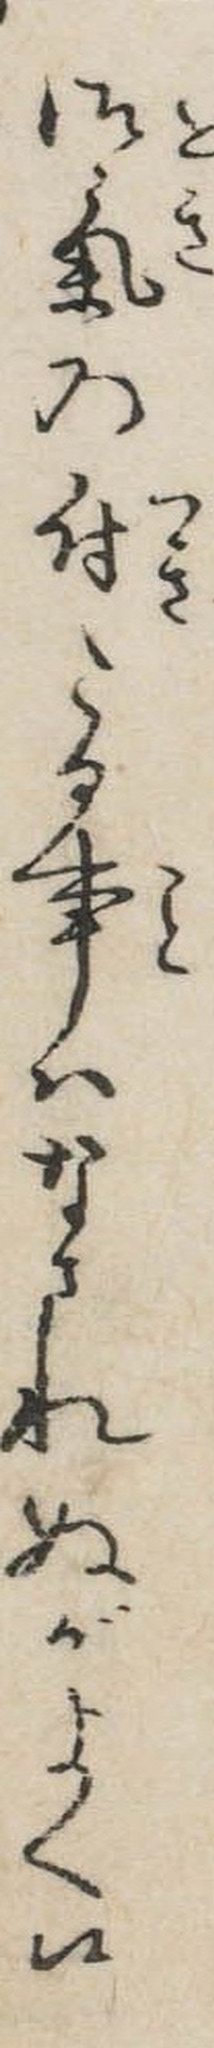御気の付たる事はなされぬがよく候
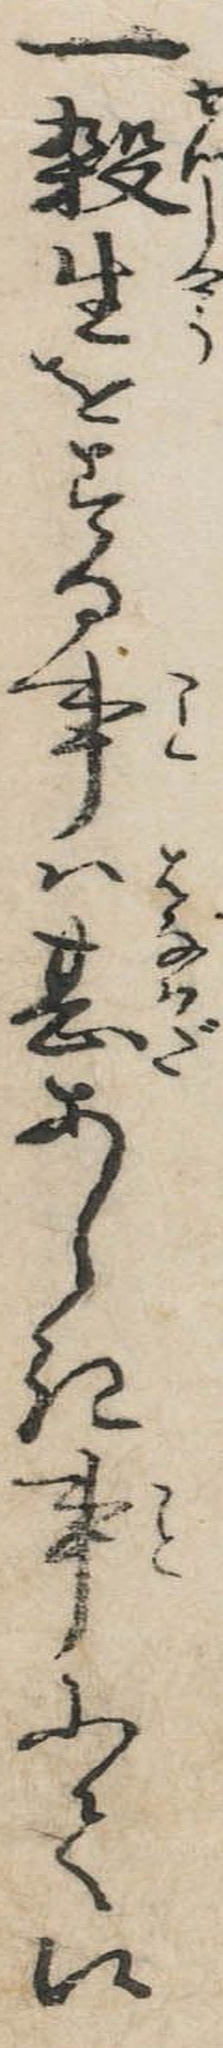一殺生をする事は甚あしき事にて候

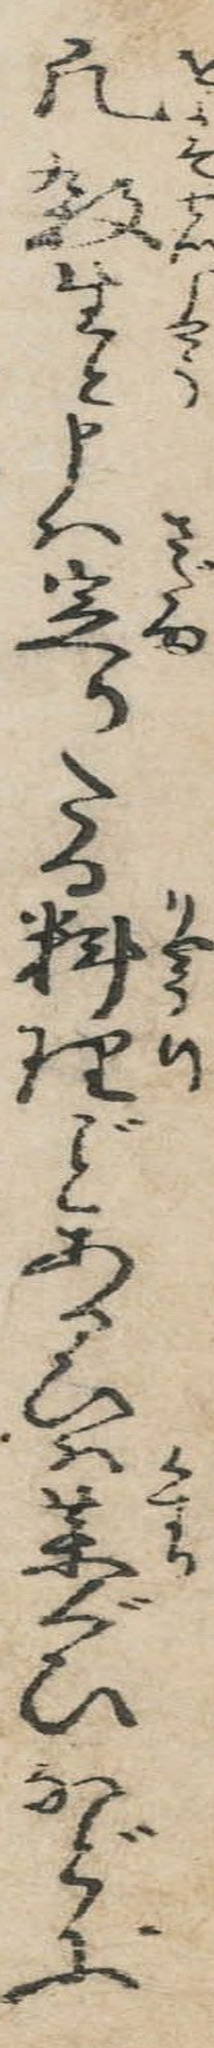凡殺生と申は定りたる料理ごとあるひは薬ぐひなどに
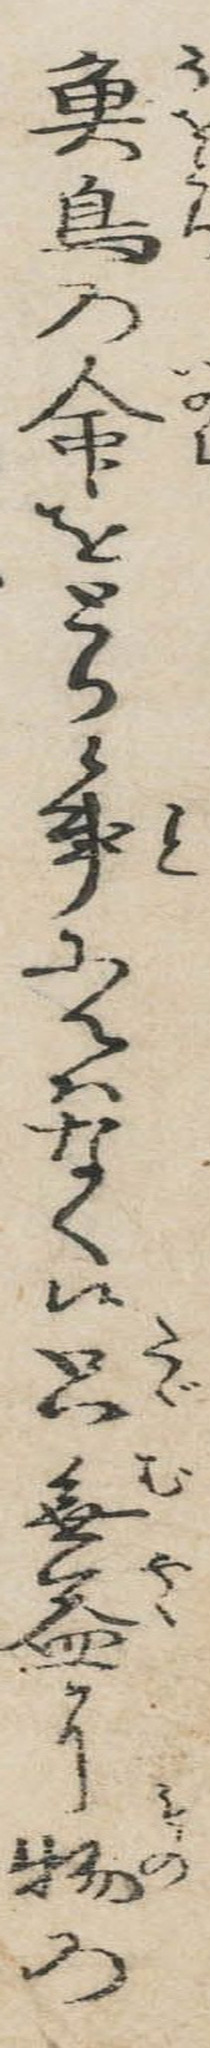魚鳥の命をとり候事にてはなく候只無益に物の
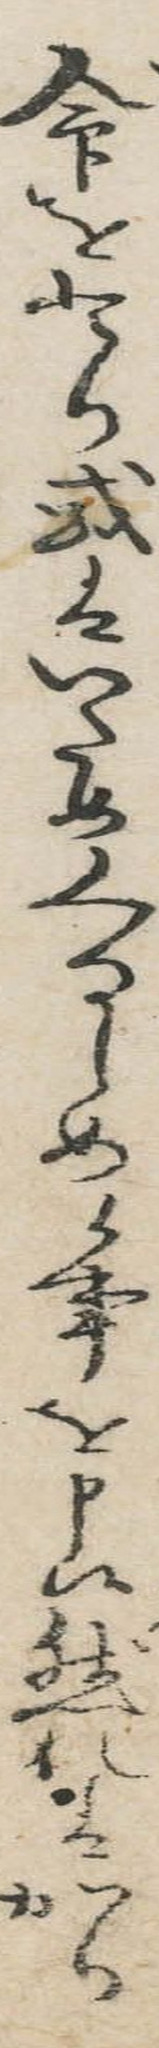命をとり或はいためくるしめ候事を申候然れはかり
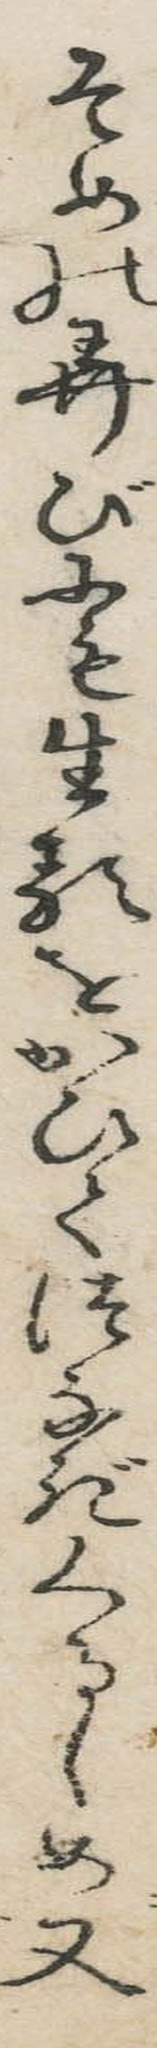そめの弄びにも生類をかひてつなぎくるしめ又
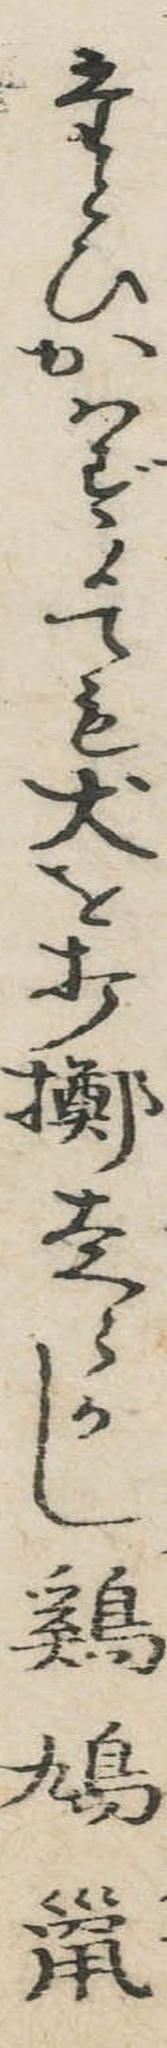たとひかわず候ても犬を打擲走らかし鶏鳩鼠
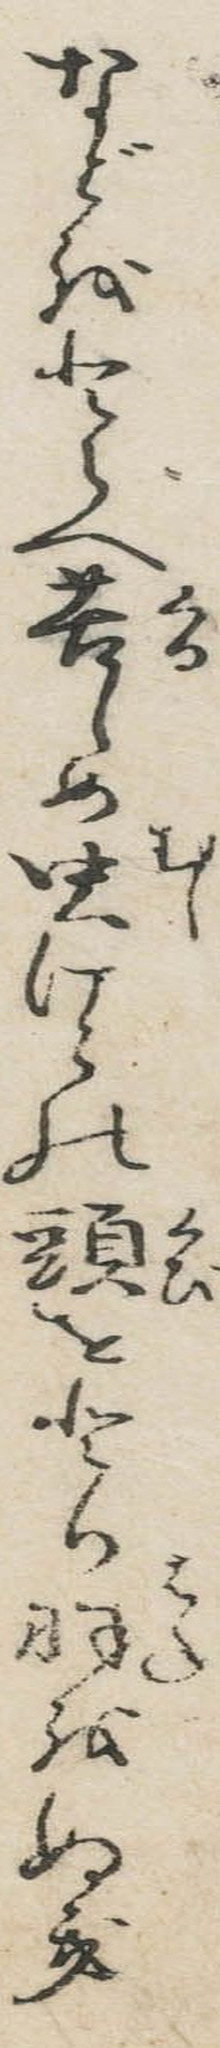などをとらへ苦しめ虫けらの頭をとり羽をぬき
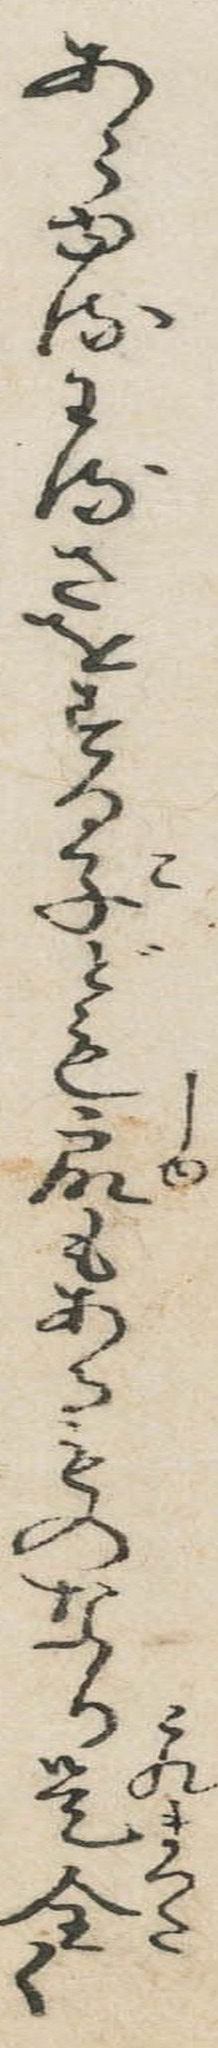あらゆるわるさをする子ども衆もあるものなり是全く
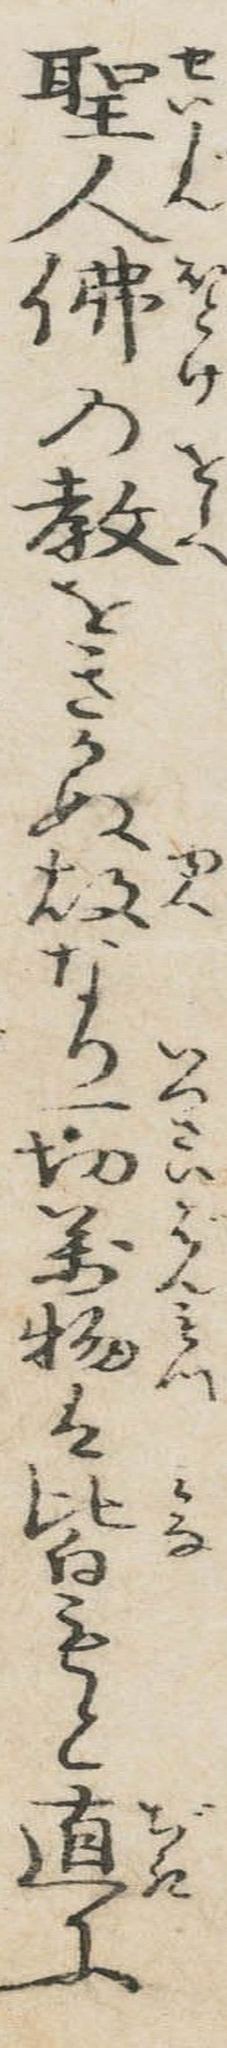聖人仏の教をきかぬ故なり一切万物は皆もと直に
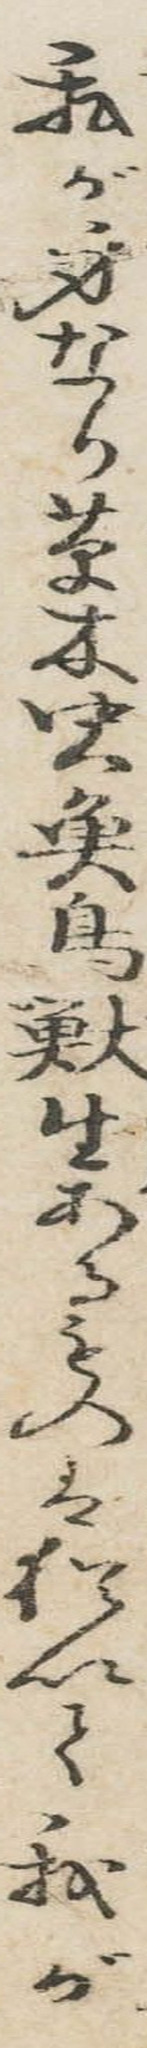我が身なり草木虫魚鳥獣生あるものは猶以て我が
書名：前訓
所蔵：東京学芸大学附属図書館
